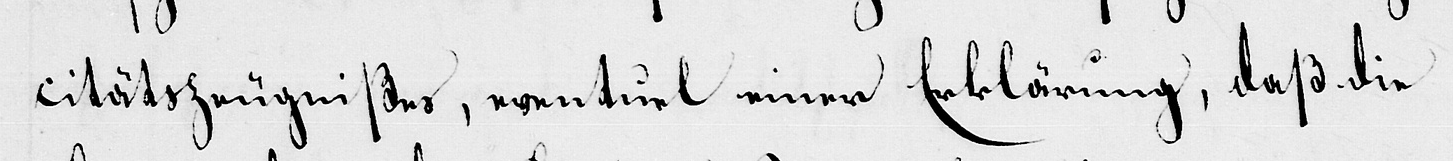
citätszeugnißes, eventuel einer Erklärung, daß die
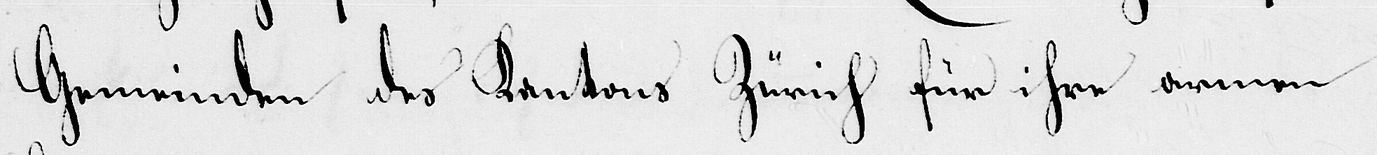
Gemeinden des Kantons Zürich für ihre armen
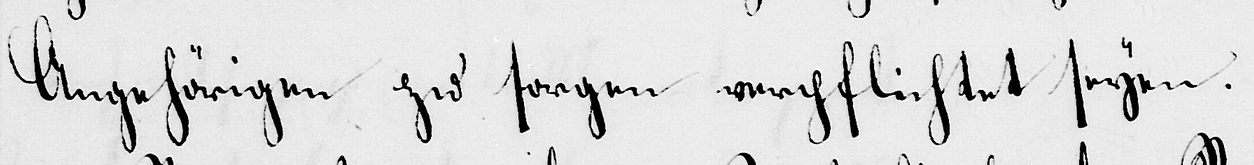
Angehörigen zu sorgen verpflichtet seyen.
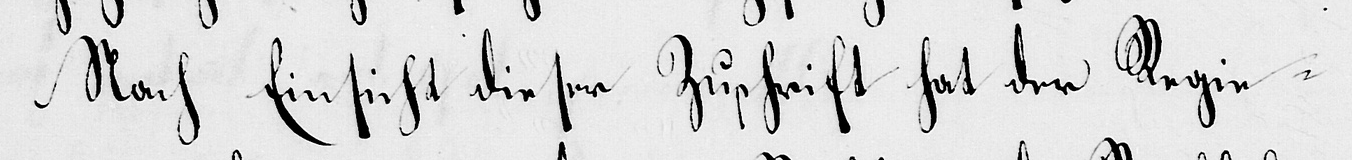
Nach Einsicht dieser Zuschrift hat der Regie¬
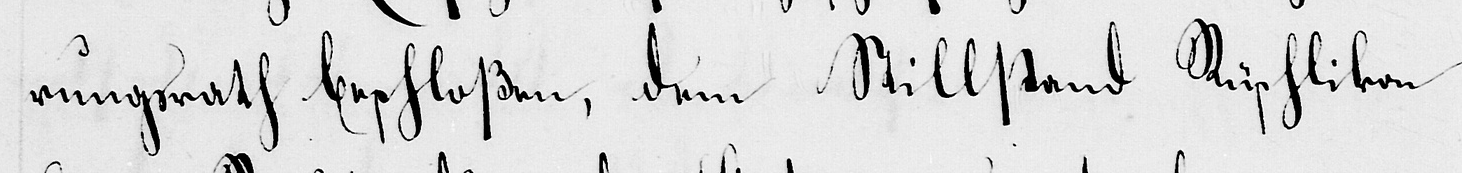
rungsrath beschloßen, dem Stillstand Rüschlikon
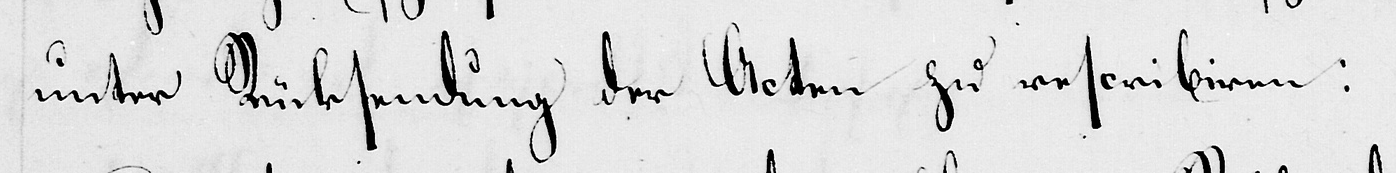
unter Rücksendung der Acten zu rescribiren:
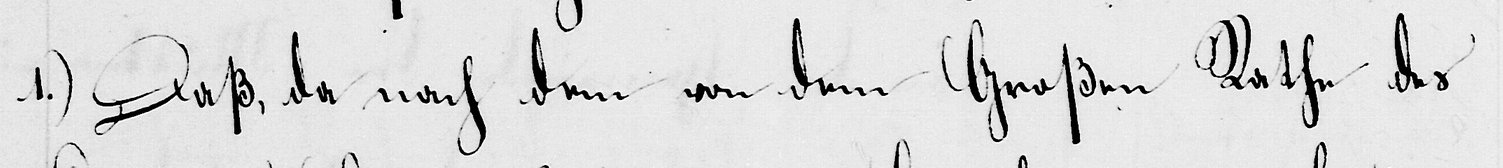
1.) Daß, da nach dem von dem Großen Rathe des
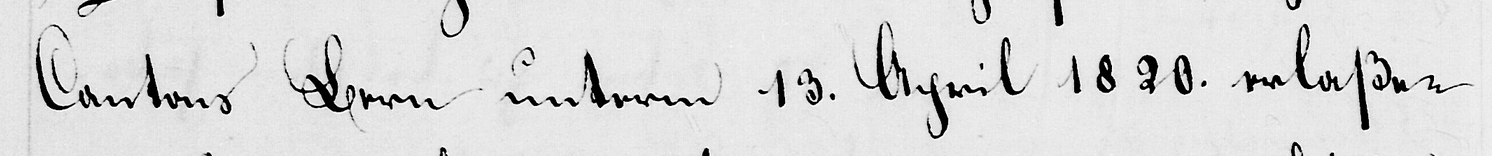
Cantons Bern unterm 13. April 1820. erlaße¬
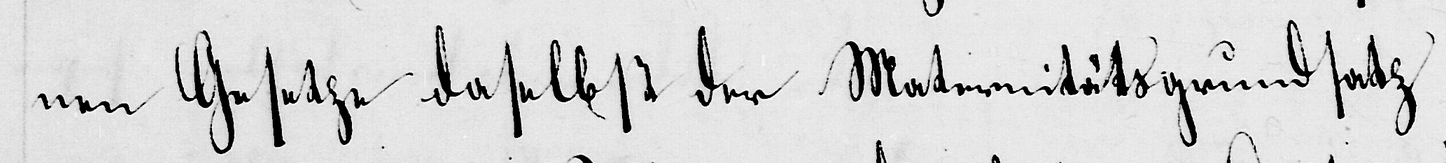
nen Gesetze daselbst der Maternitätsgrundsatz
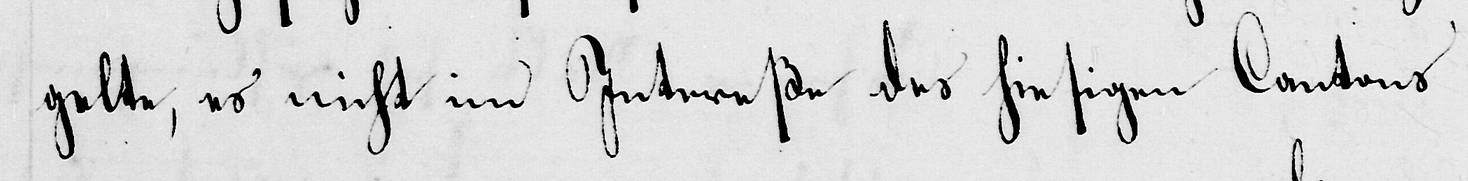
gelte, es nicht im Intereße des hiesigen Cantons
